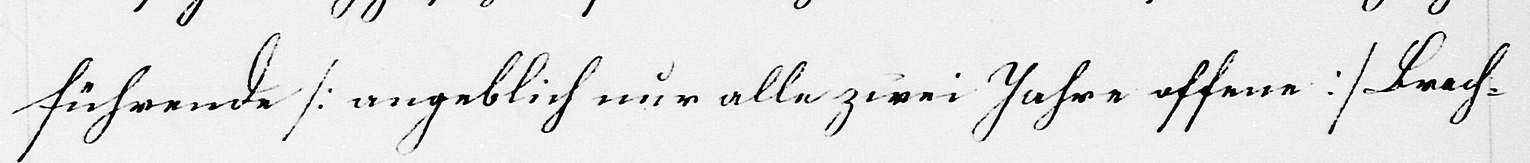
führende [angeblich nur alle zwei Jahre offene] Brach¬
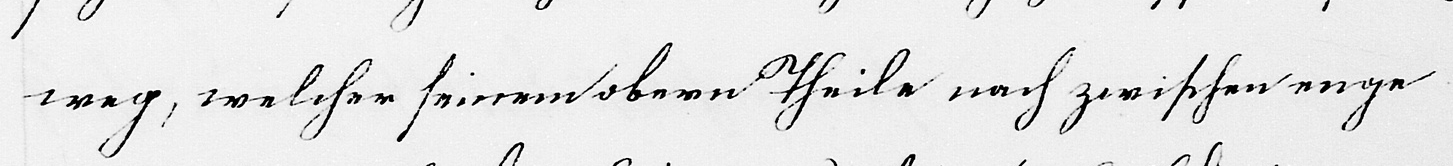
weg, welcher seinem obern Theile nach zwischen enge
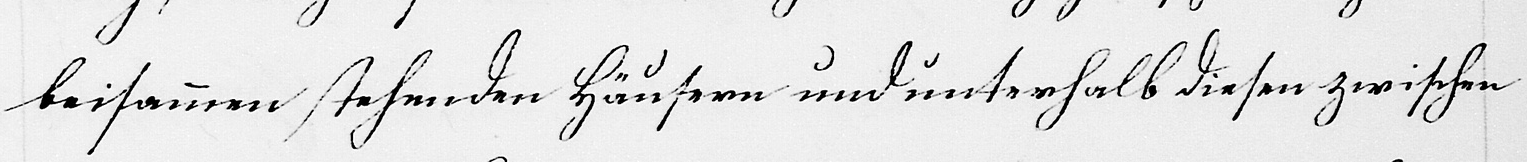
beisammen stehenden Häusern und unterhalb diesen zwischen
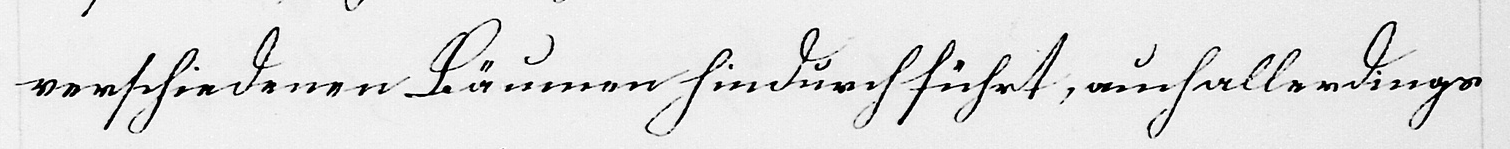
verschiedenen Bäumen hindurch führt, auch allerding
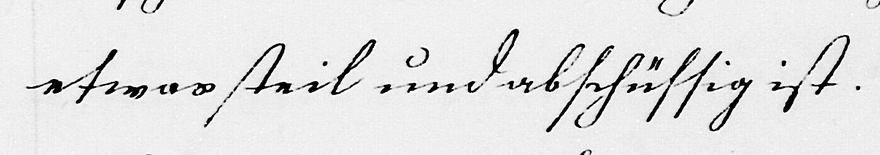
etwas steil und abschüssig ist.
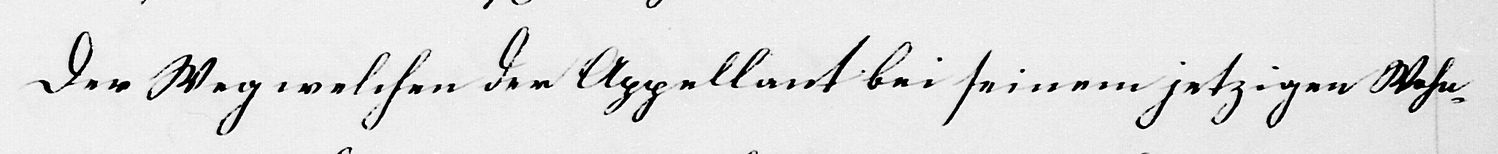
Der Weg welchen der Appellant bei seinem jetzigen Wohn¬
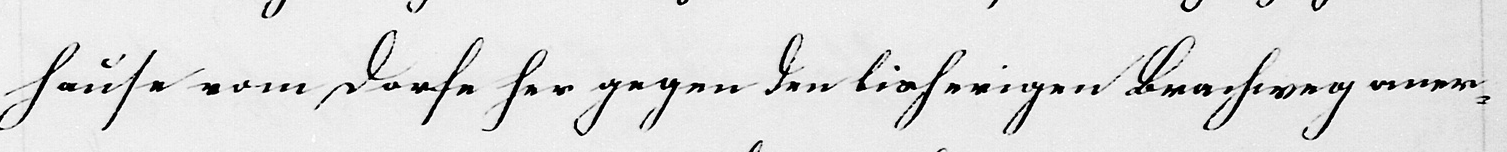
hause vom Dorfe her gegen den bisherigen Brachweg aner¬
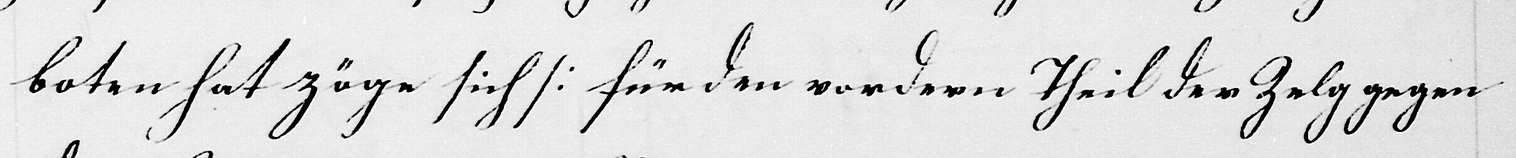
boten hat zöge sich [für den vordern Theil der Zelg gegen
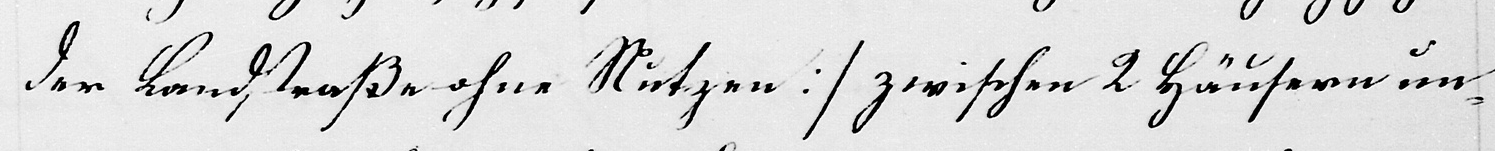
der Landstraße ohne Nutzen] zwischen 2 Häusern un¬
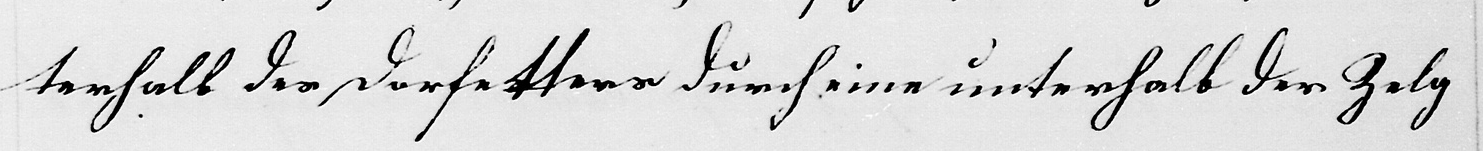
terhalb des Dorfetters durch eine unterhalb der Zelg
